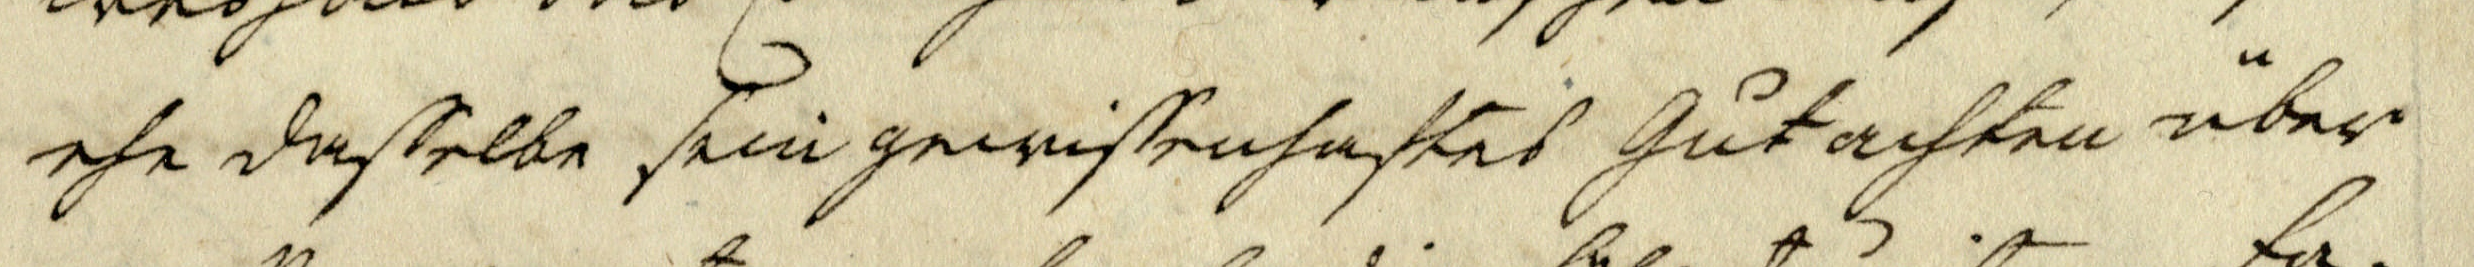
ehe dasselbe sein gewissenhaftes Gutachten über
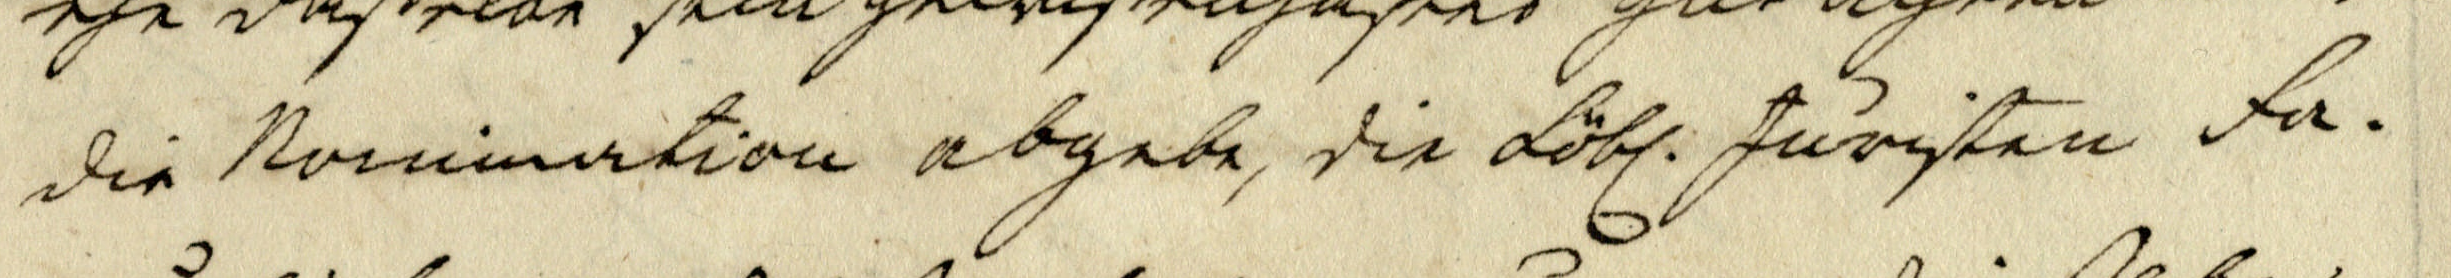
die Nomination abgebe, die Löbl. Juristen Fa¬
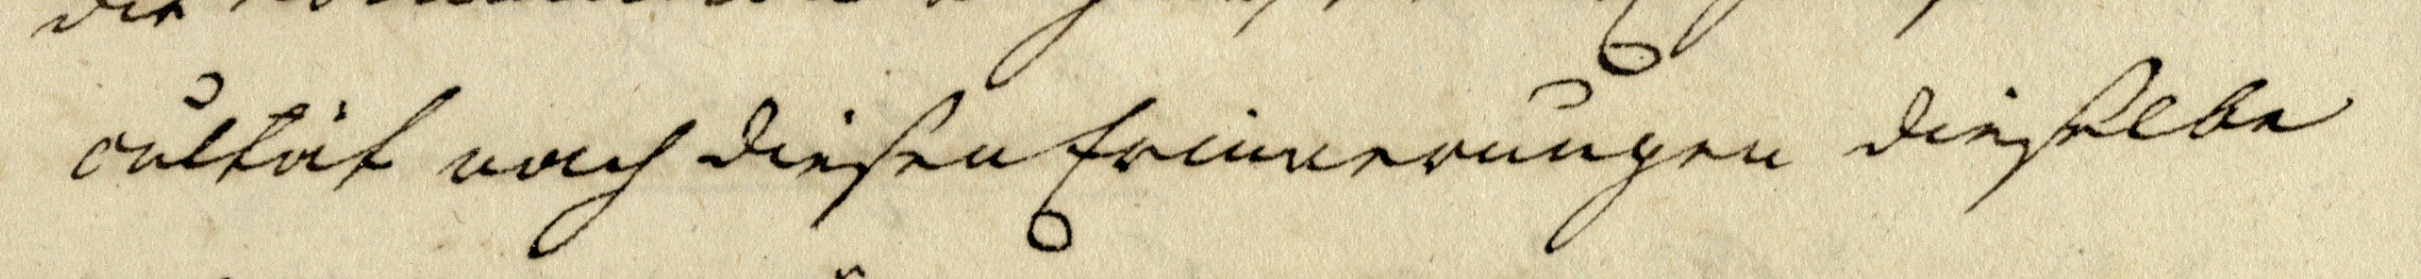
cultät nach diesen Erinnerungen dieselbe
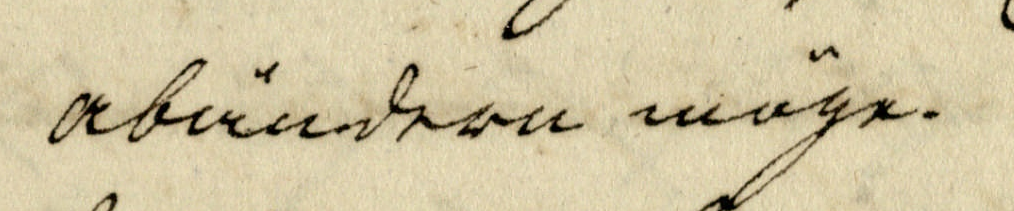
abändern möge.
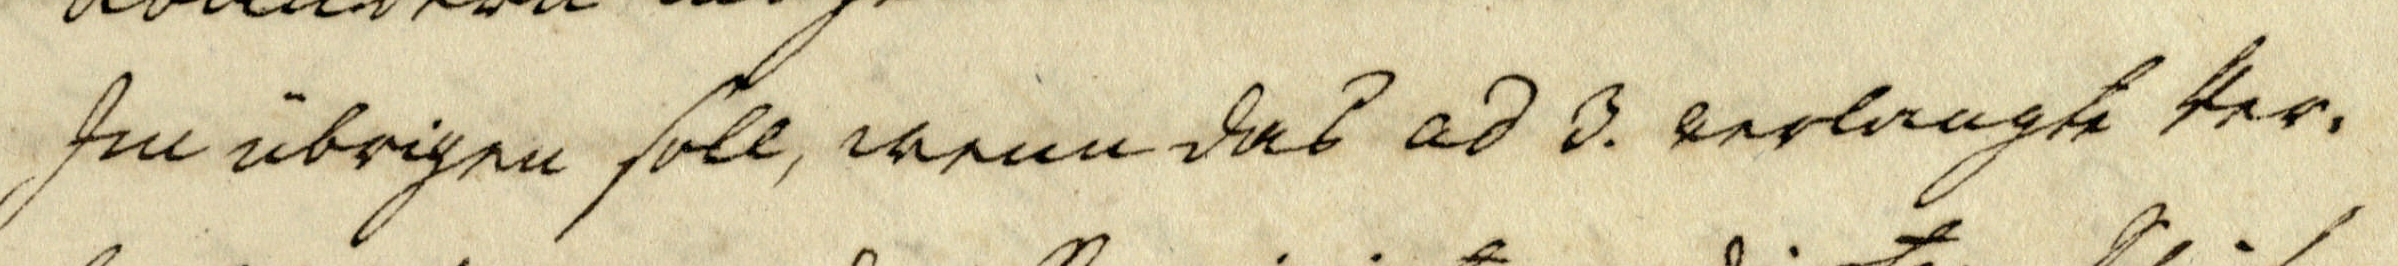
Im übrigen soll, wenn das ad 3. verlangte Ver¬
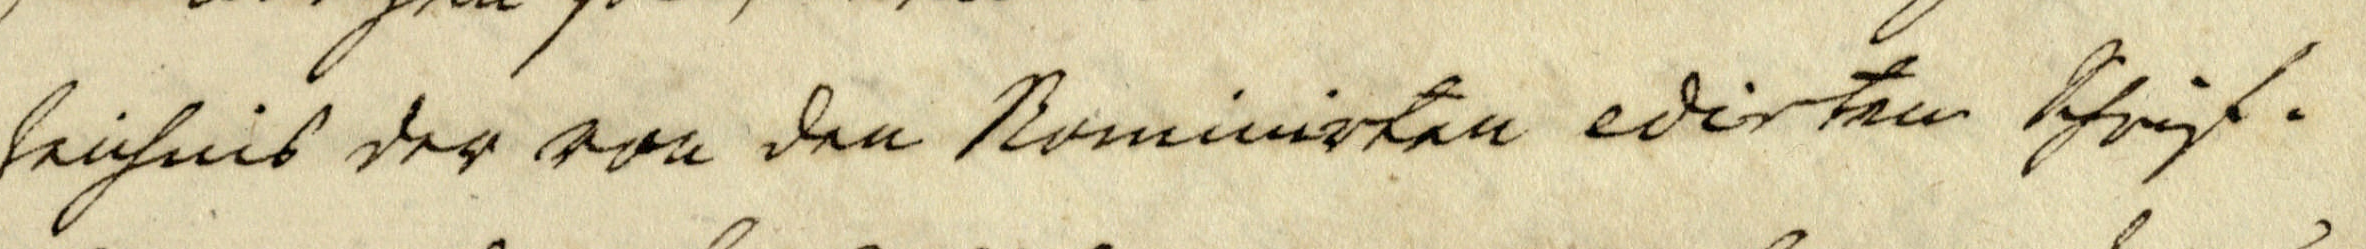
zeichnis der von den Nominirten edirten Schrif¬
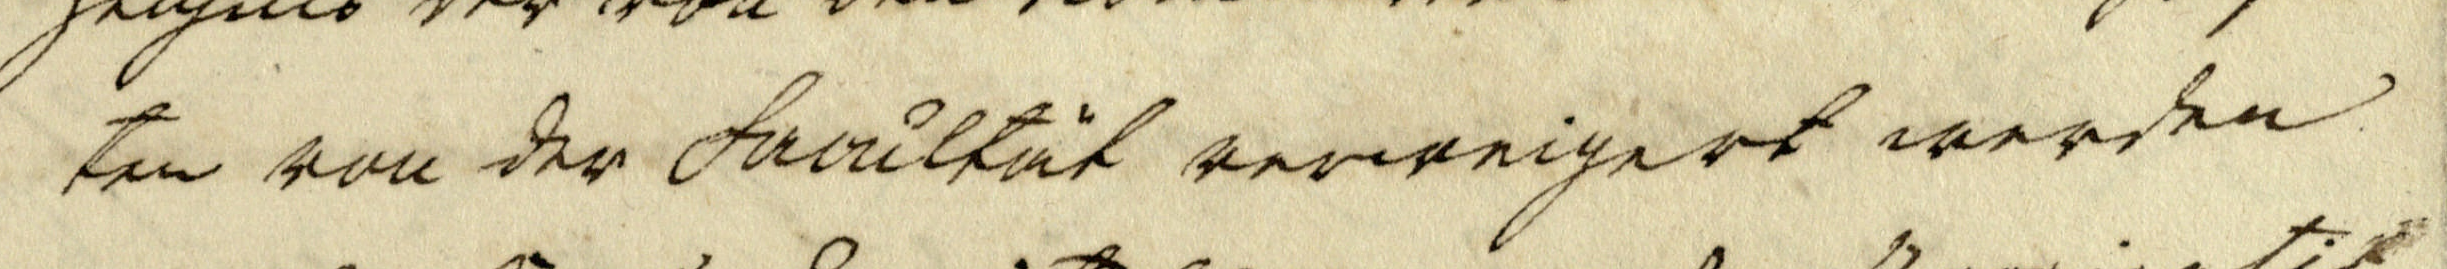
ten von der Facultät verweigert werden
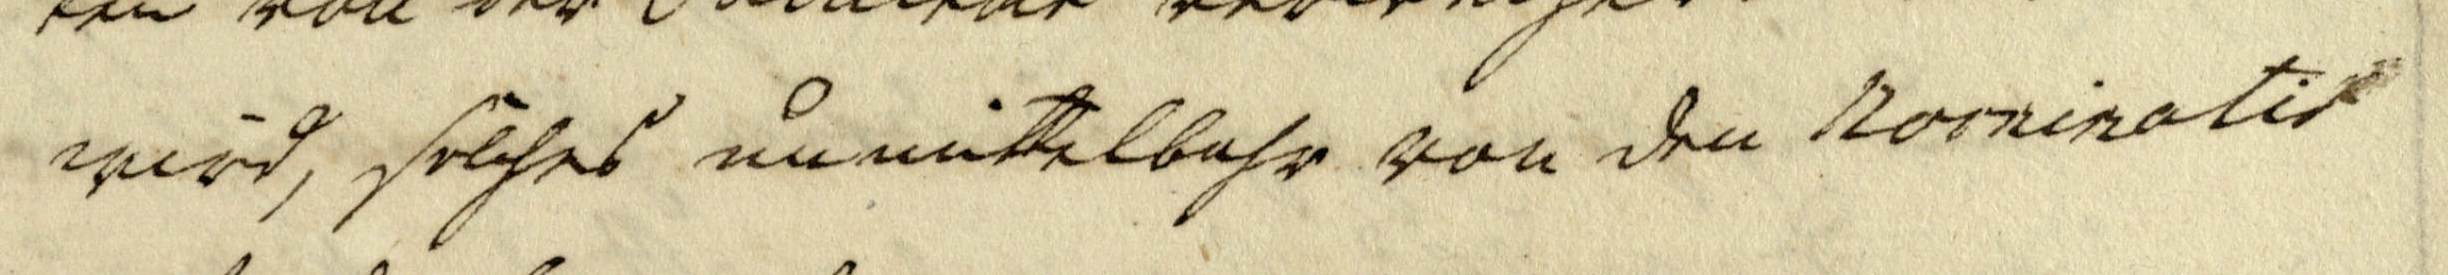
wird, solches unmittelbahr von den Nominatis
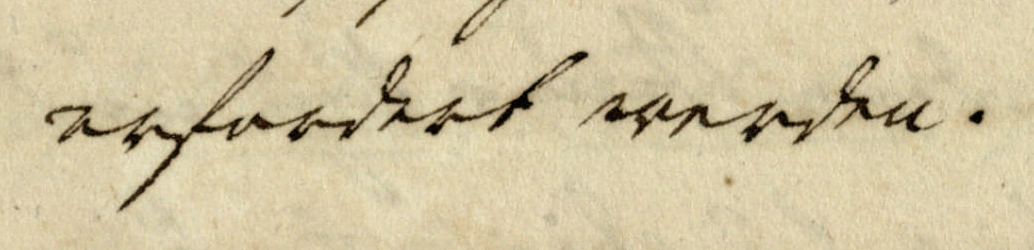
erfordert werden.
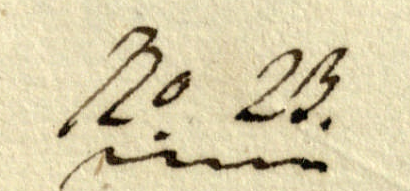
No 23.
